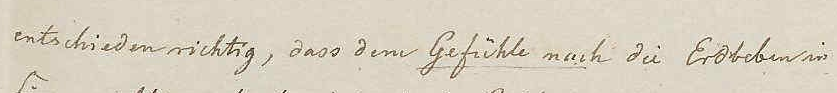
entschieden richtig, dass dem Gefühle nach die Erdbeben in
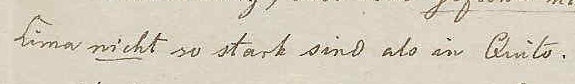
Lima nicht so stark sind als in Quito.
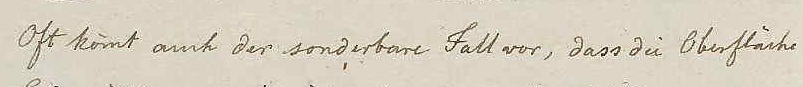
Oft kömt auch der sonderbare Fall vor, dass die Oberfläche
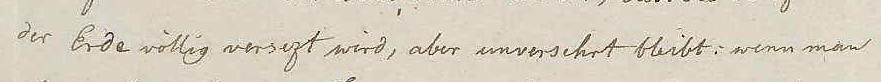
der Erde völlig versezt wird, aber unversehrt bleibt: wenn man
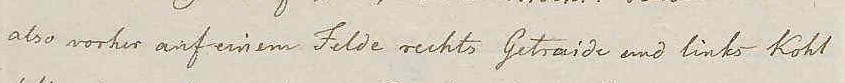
also vorher auf einem Felde rechts Getreide und links Kohl
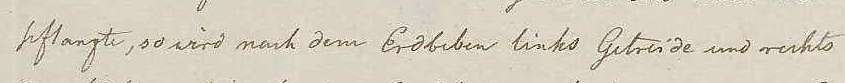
pflanzte, so wird nach dem Erdbeben links Getreide und rechts
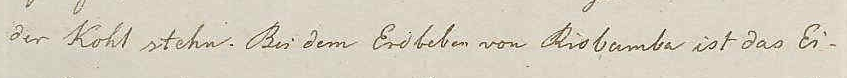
der Kohl stehn. Bei dem Erdbeben von Riobamba ist das Ei-
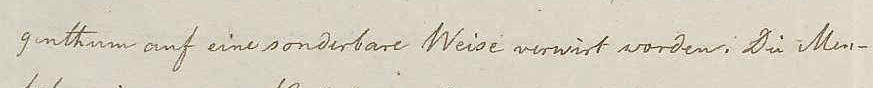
genthum auf eine sonderbare Weise verwirt worden. Die Men-
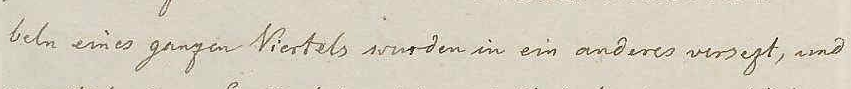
beln eines ganzen Viertels wurden in ein anderes versezt, und
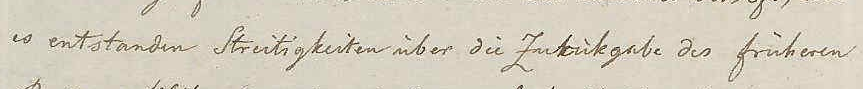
es entstanden Streitigkeiten über die Zukrükgabe des früheren
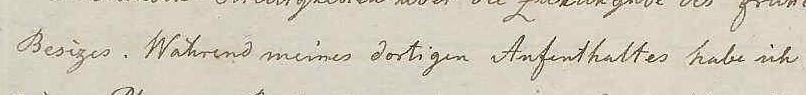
Besizes. Während meines dortigen Aufenthaltes habe ich
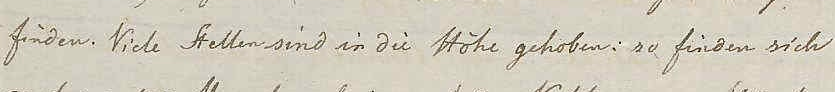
finden. Viele Stellen sind in die Höhe gehoben: so finden sich
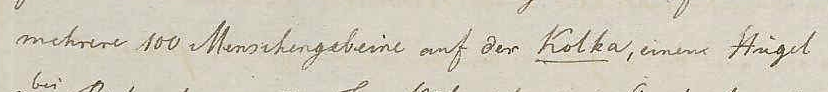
mehrere 100 Menschengebeine auf der Kolka, einem Hügel
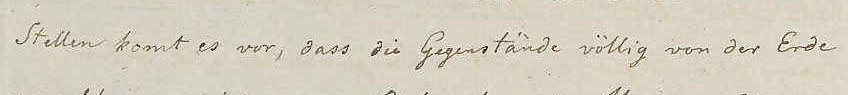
Stellen komt es vor, dass die Gegenstände völlig von der Erde
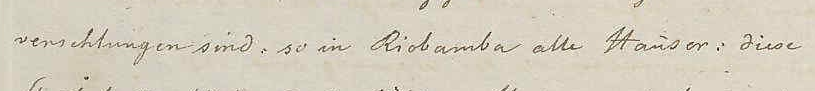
verschlungen sind: so in Riobamba alle Häuser: diese
